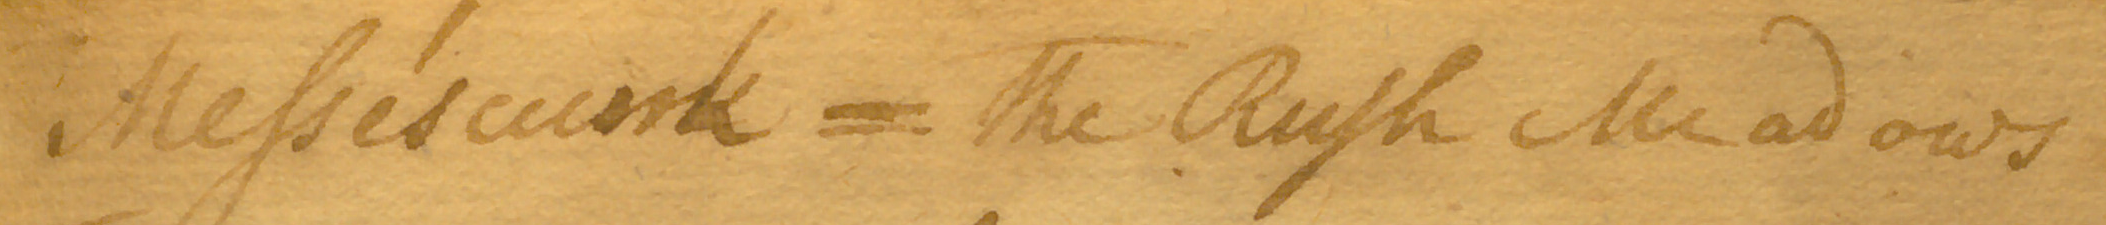Messéscunk = The Rush Meadows
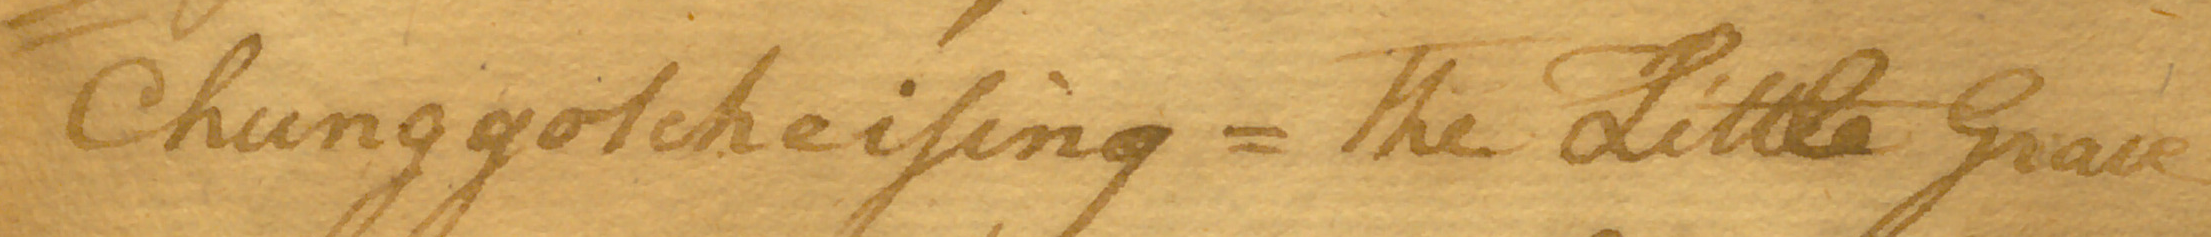Chunggotcheising = The Little Grave
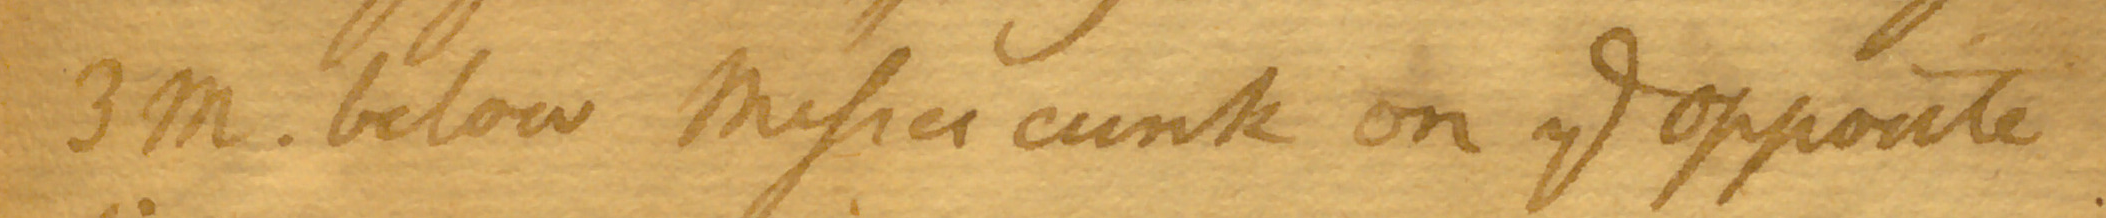3 M. below Messescunk on y^e opposite
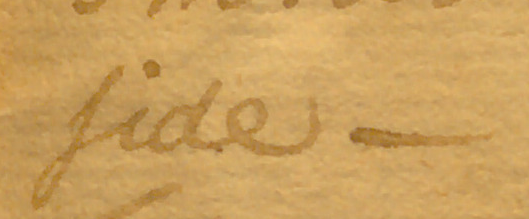side-
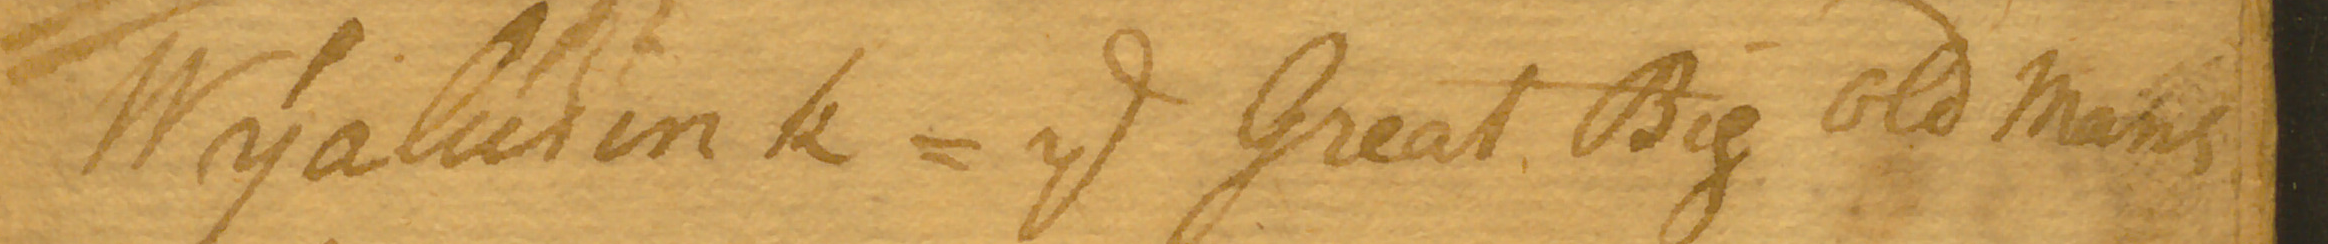Wýalusink = y^e Great Big old mans
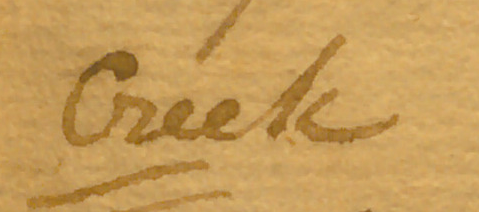creek
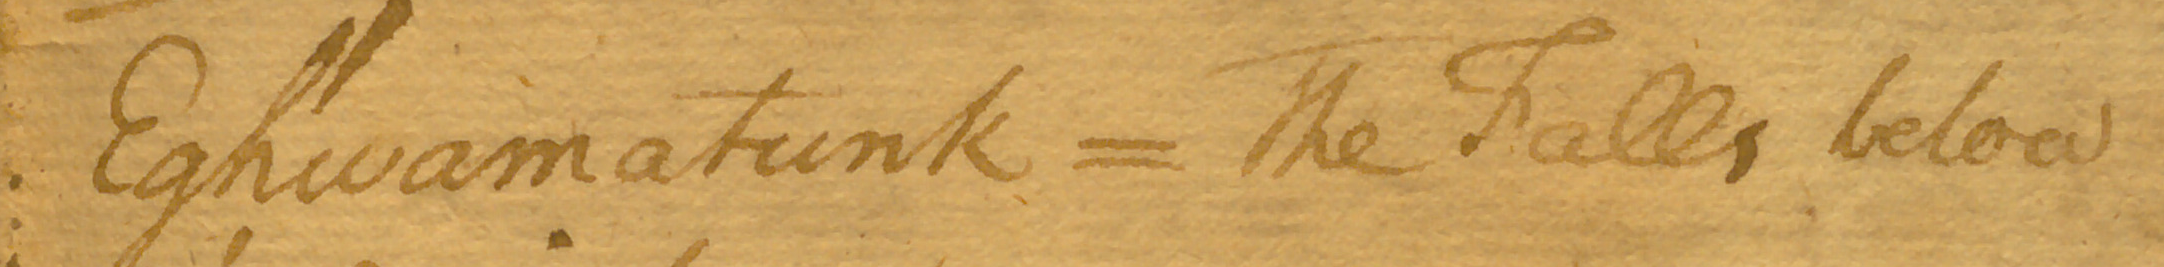Eghwámatunk = The Falls below
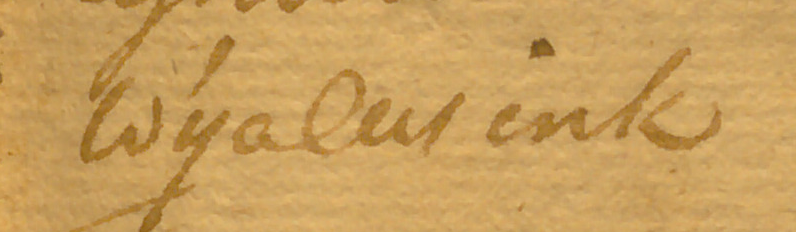Wýalusink
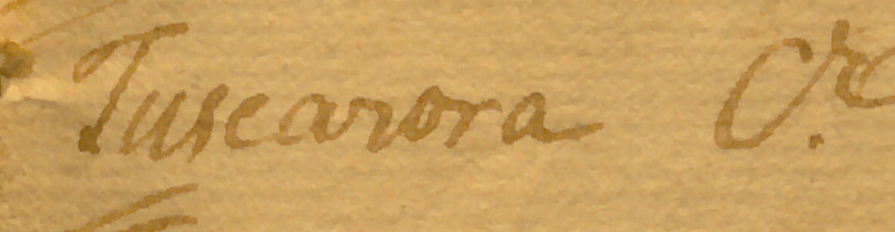Tuscarora C^r.
